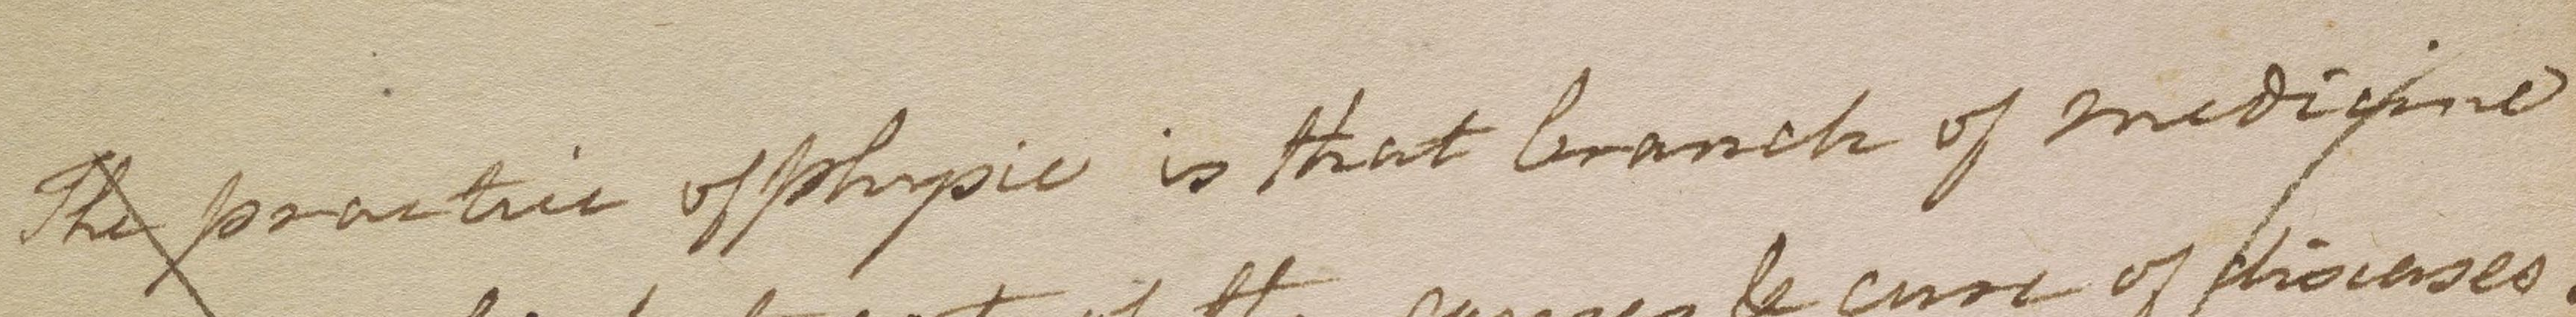The practice of physic is that branch of medicine
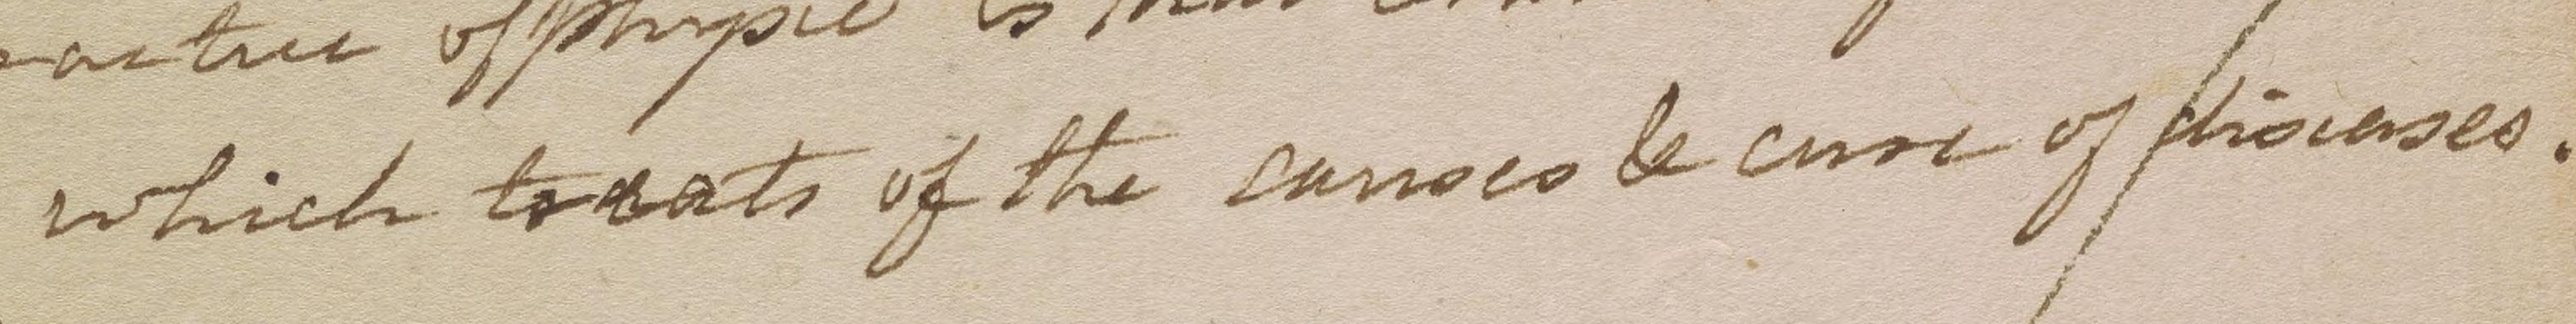which treats of the causes and cure of diseases.
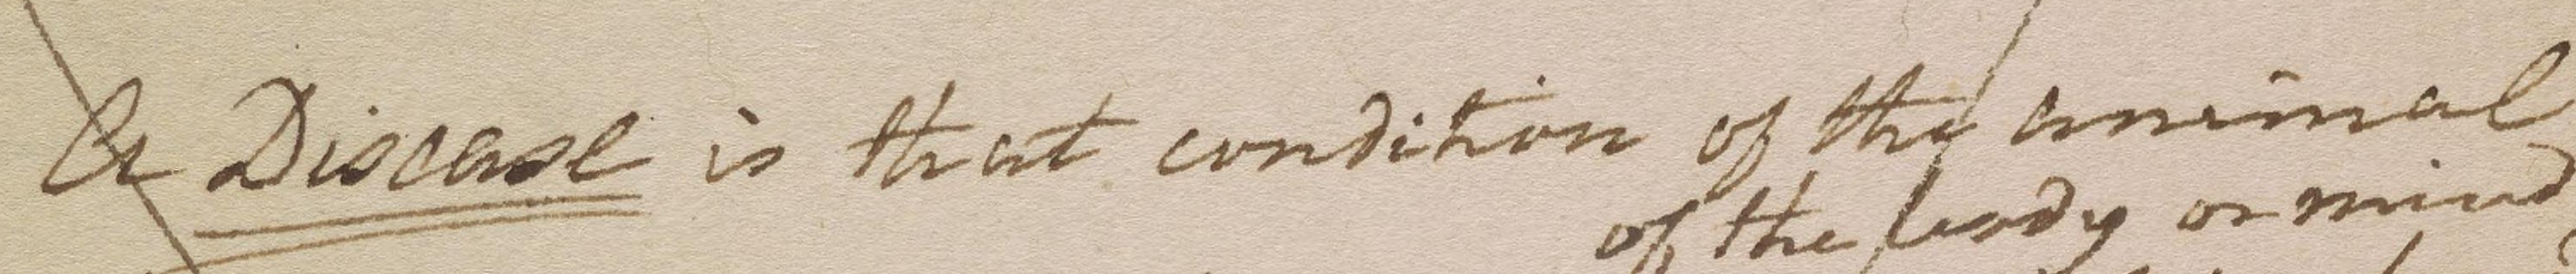A Disease is that condition of the animal
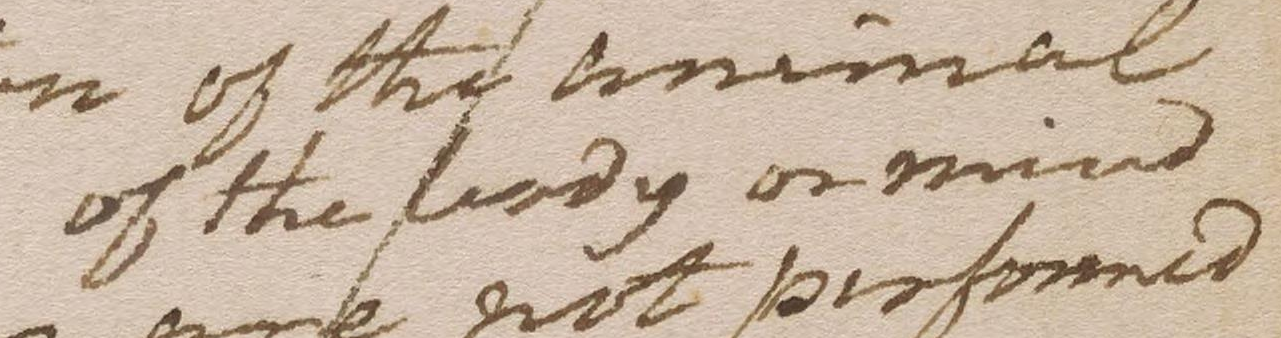of the body or mind
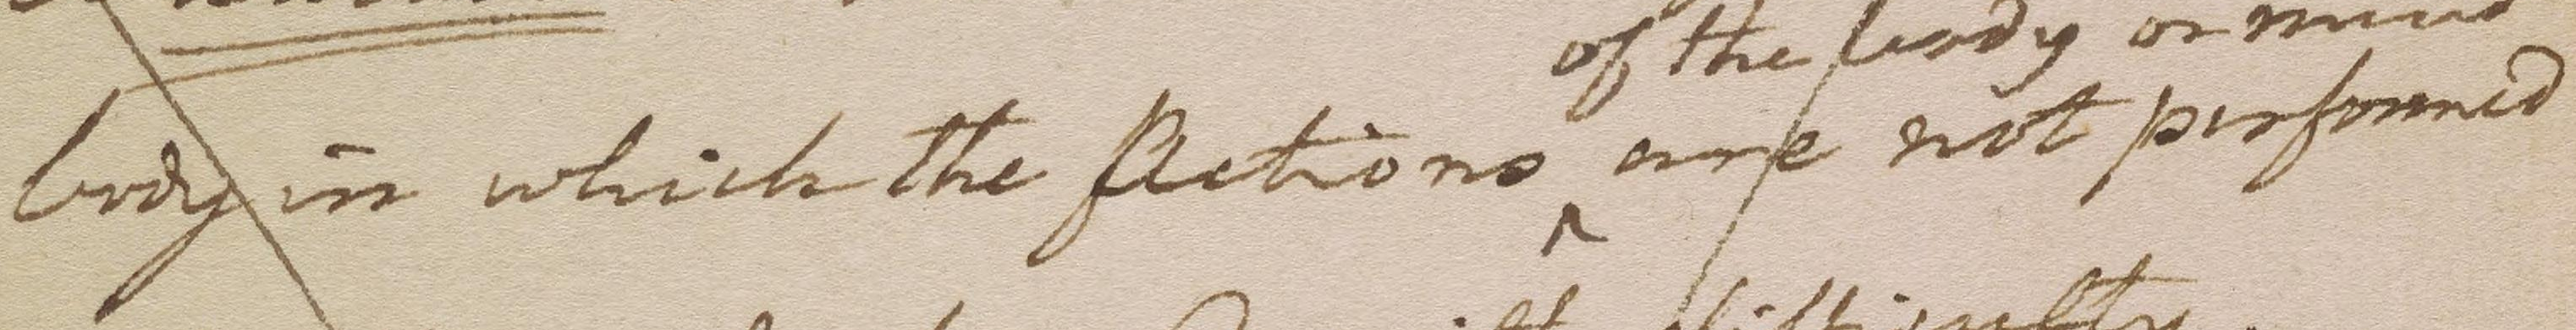body in which the Actions ^ are not performed
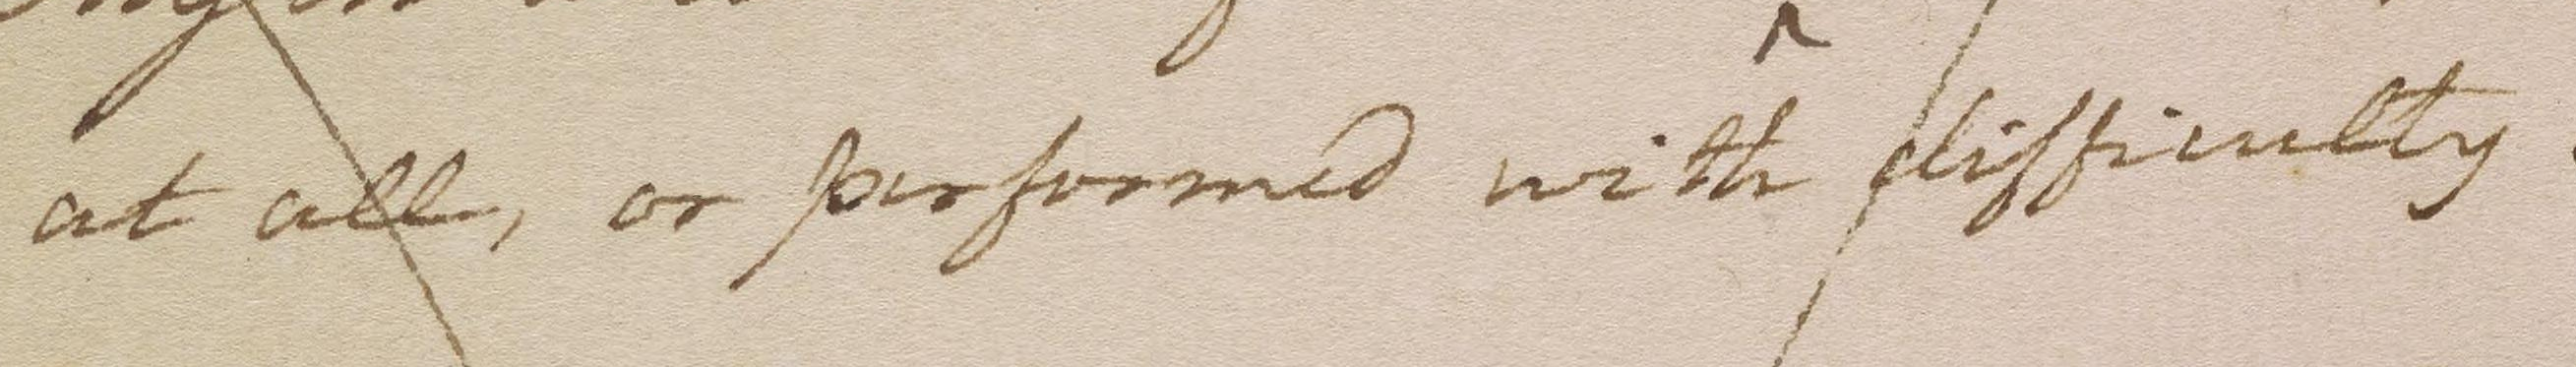at all, or performed with difficulty.
